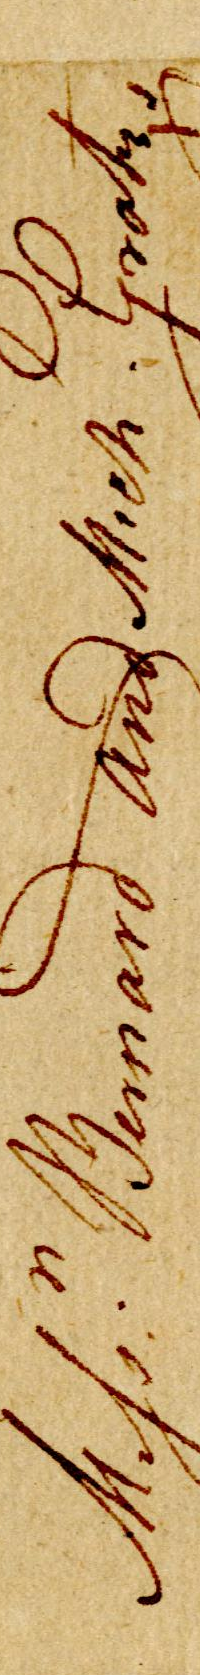Mess^rs Barnard and Mich^l Gratz
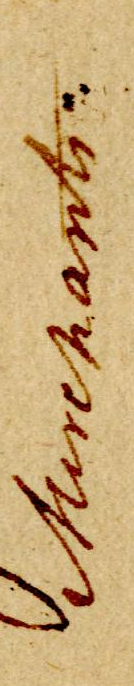Merchants
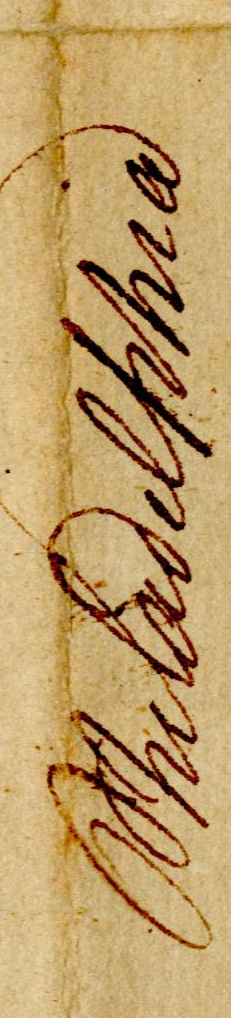Philadelphia
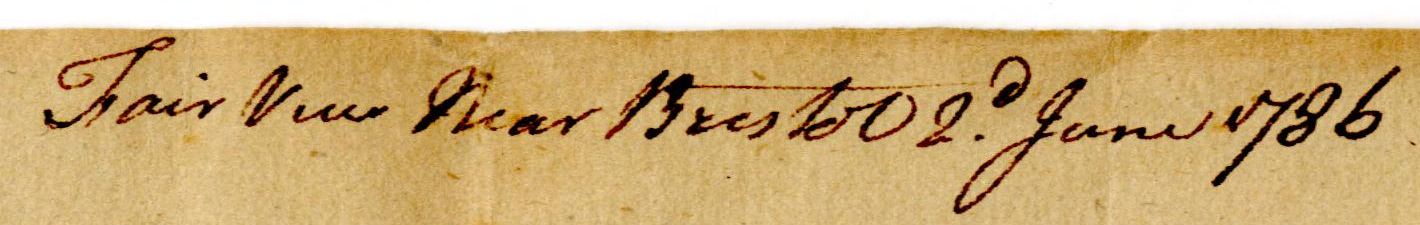Fairview Near Bristol 2^d June 1786
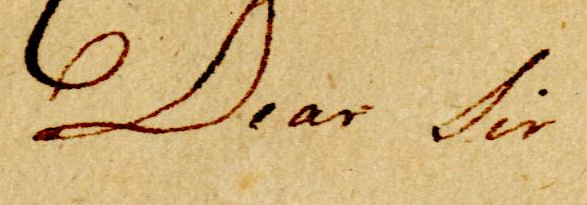Dear Sir
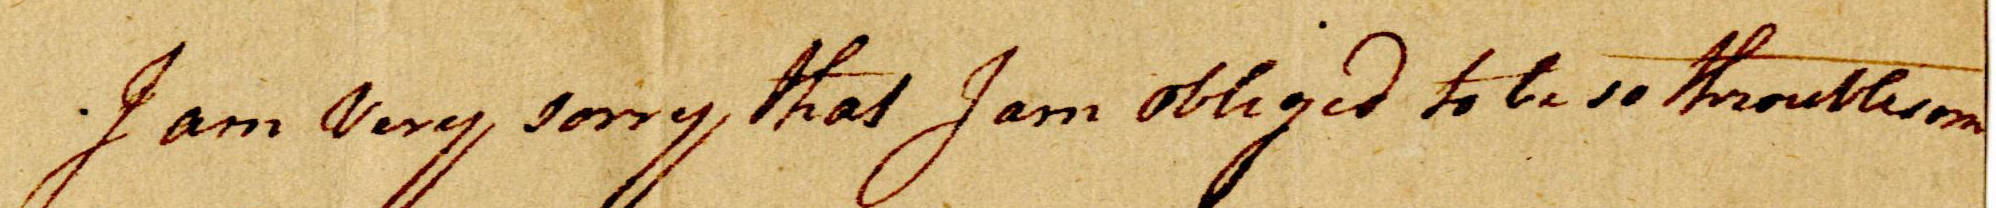I am very sorry that I am obliged to be so troublesom
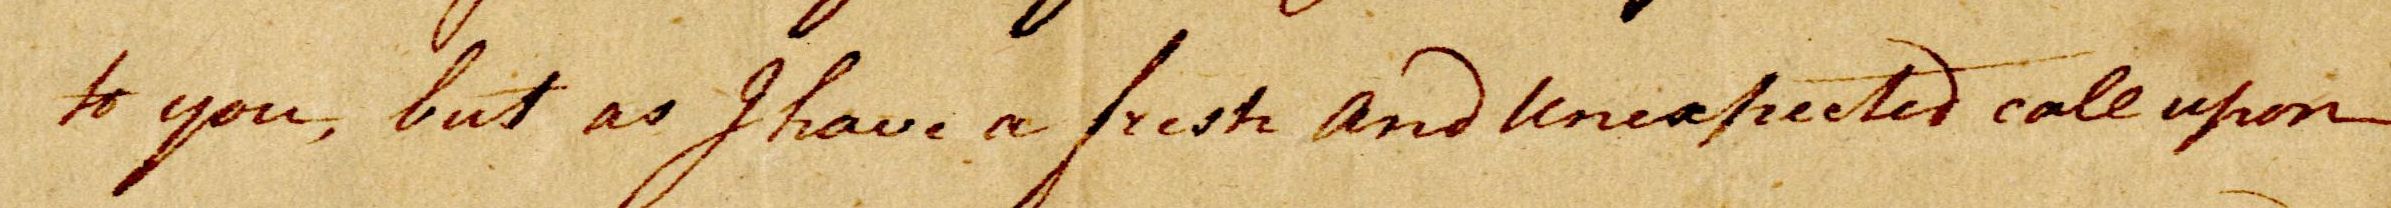to you, but as I have a fresh and unexpected call upon
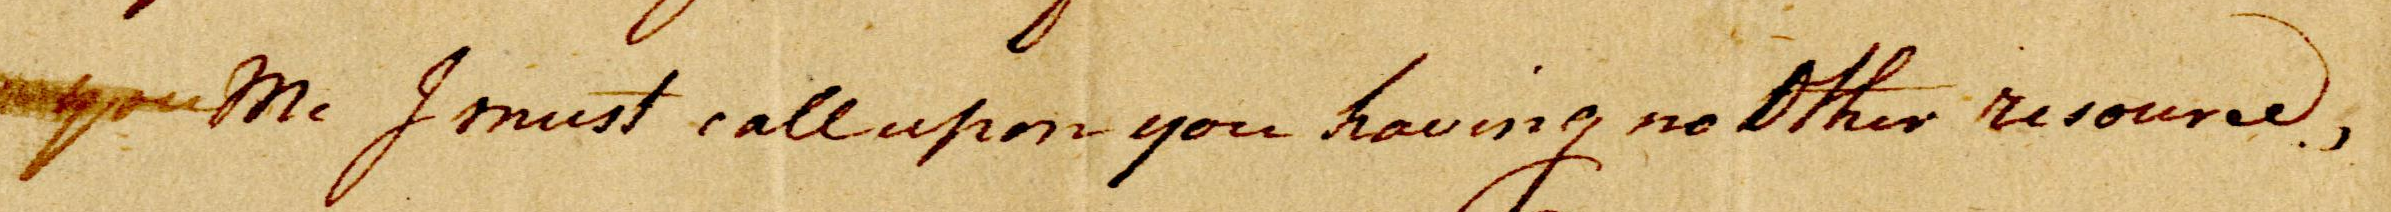[you] Me I must call upon you having no other resource,
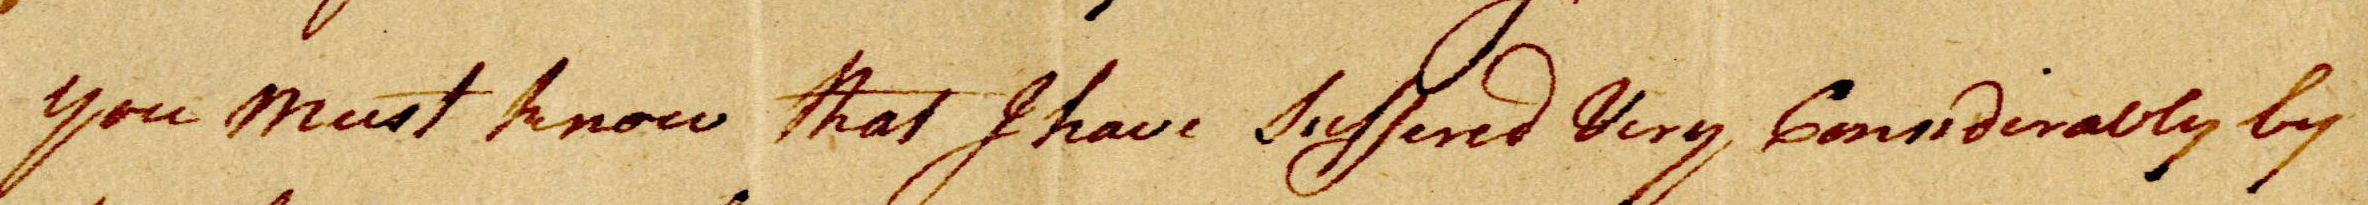you must know that I have suffered Very Considerably by
